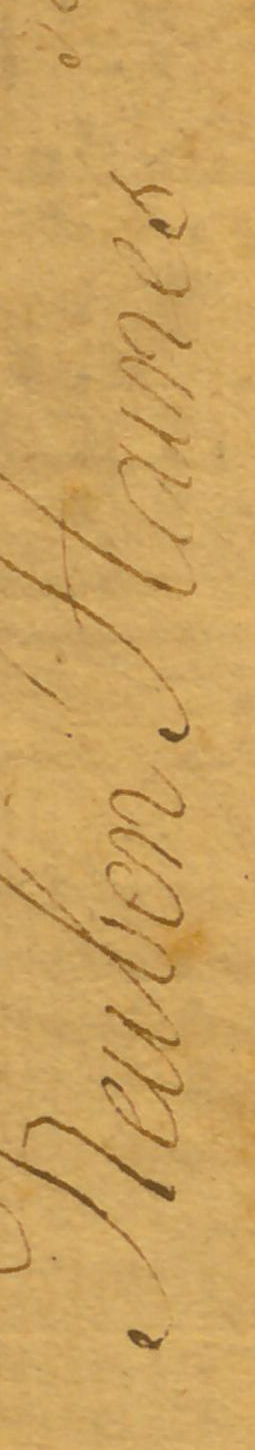Reuben Haines
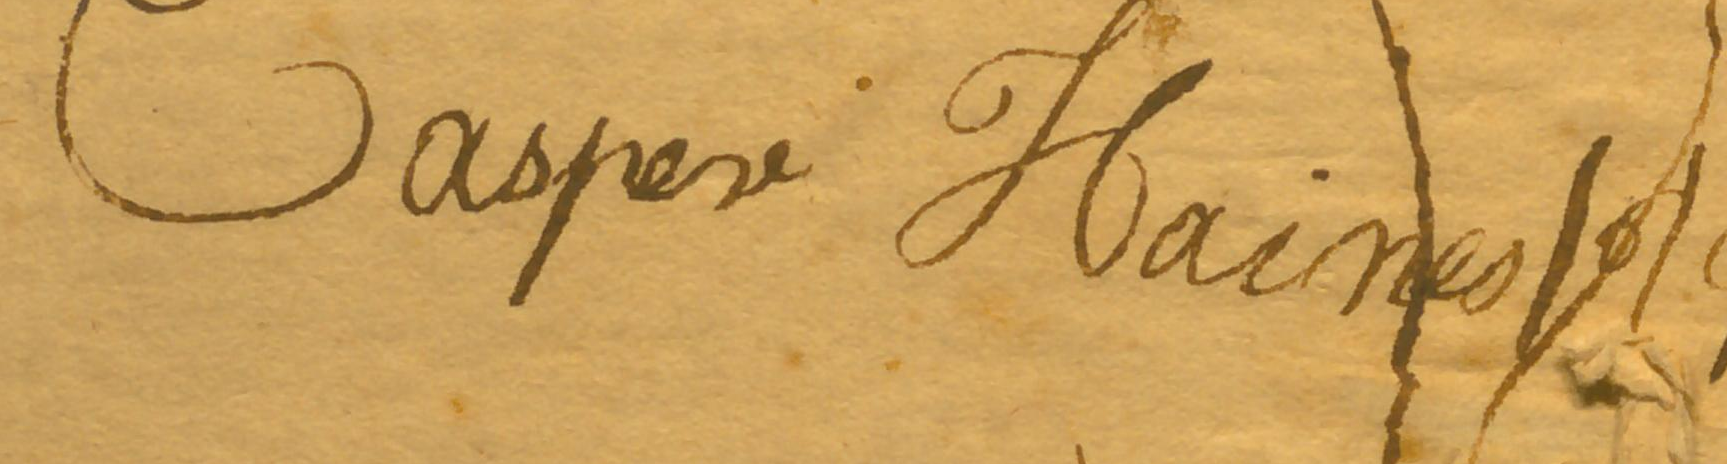Casper Haines
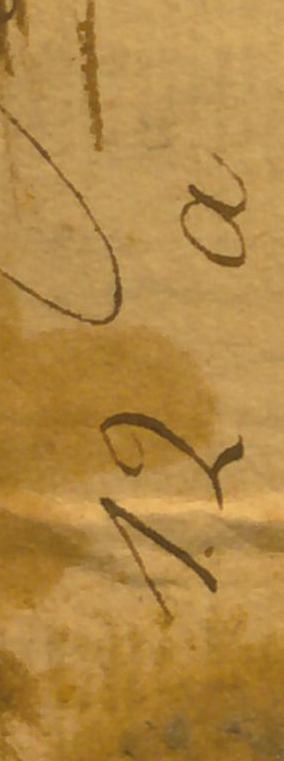12 a
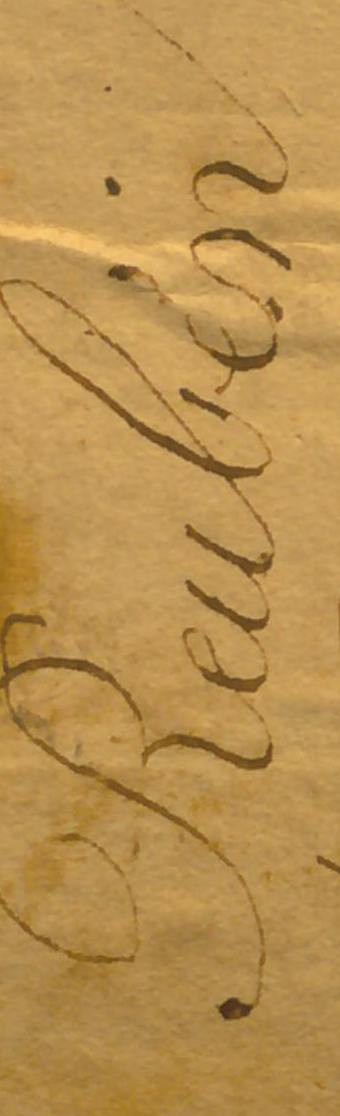Reuben
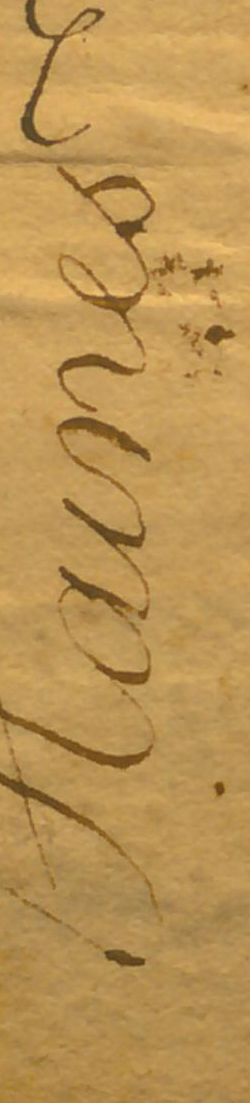Haines
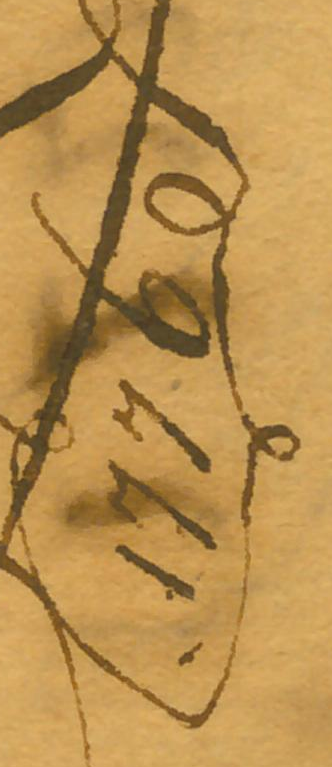1776
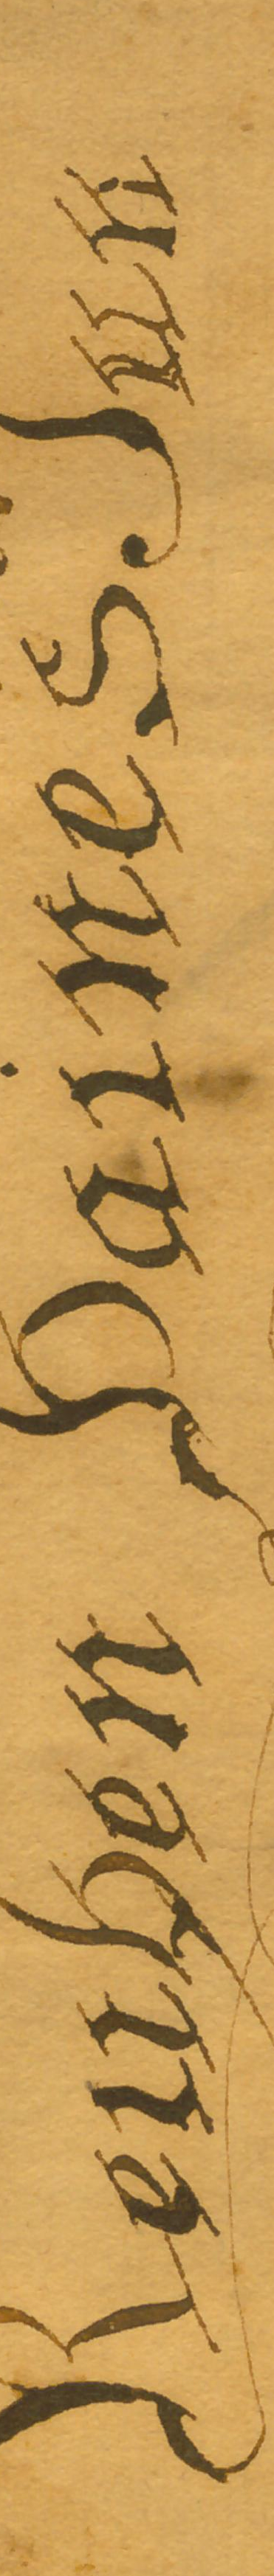Reuben Haines Jun
